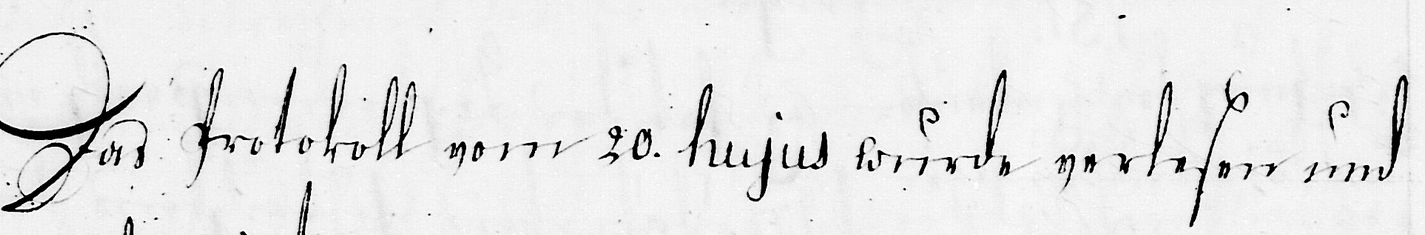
Das Protokoll vom 20. hujus wurde verlesen und
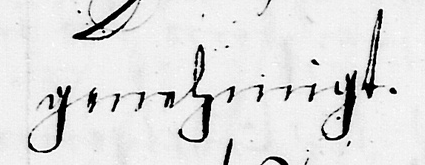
genehmigt.
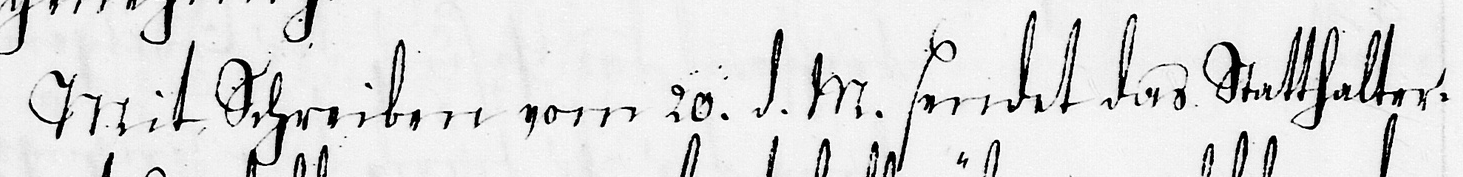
Mit Schreiben vom 20. d. M. sendet das Statthalter¬
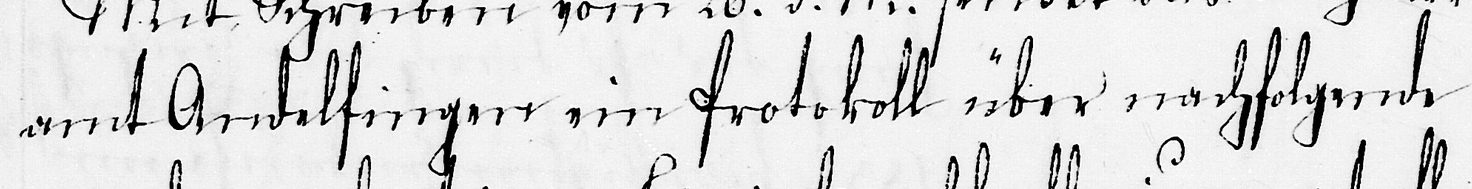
amt Andelfingen ein Protokoll über nachfolgende
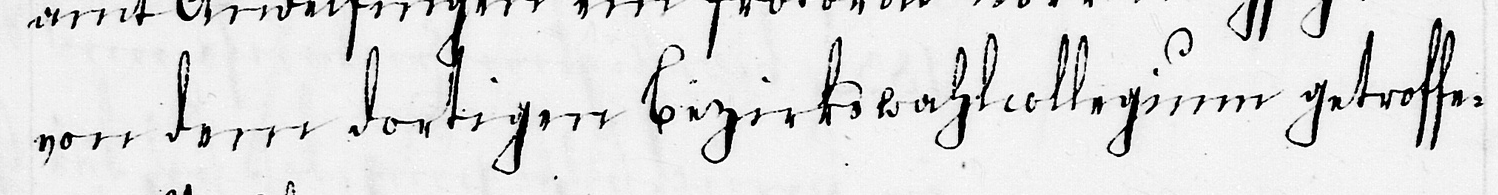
von dem dortigen Bezirkswahlcollegium getroff¬
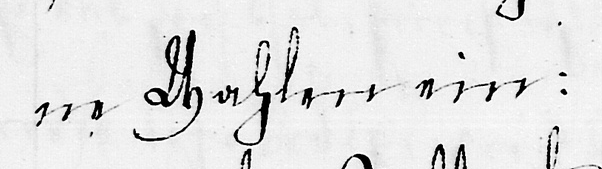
ene Wahlen ein:
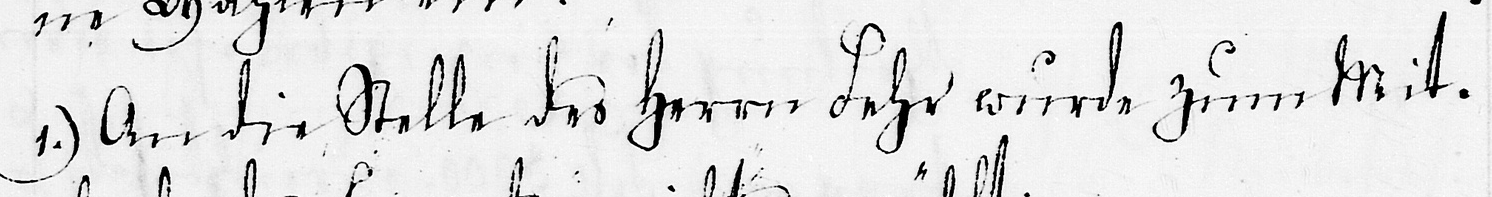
1.) An die Stelle des Herrn Fehr wurde zum Mit¬
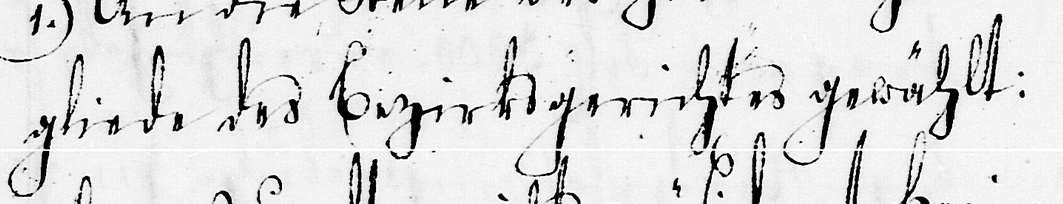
gliede des Bezirksgerichtes gewählt:
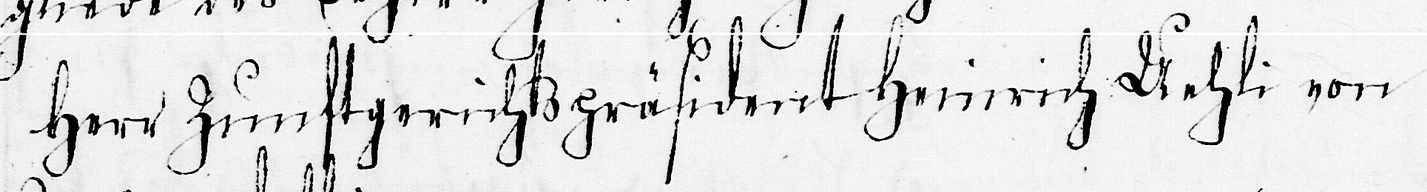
Herr Zunftgerichtspräsident Heinrich Uehli von
